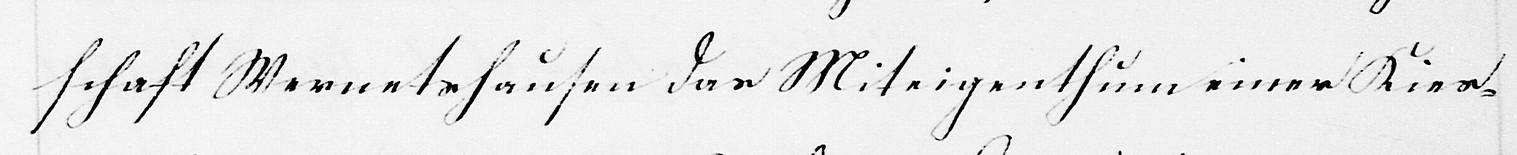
schaft Wernetshausen das Miteigenthum einer Kies¬
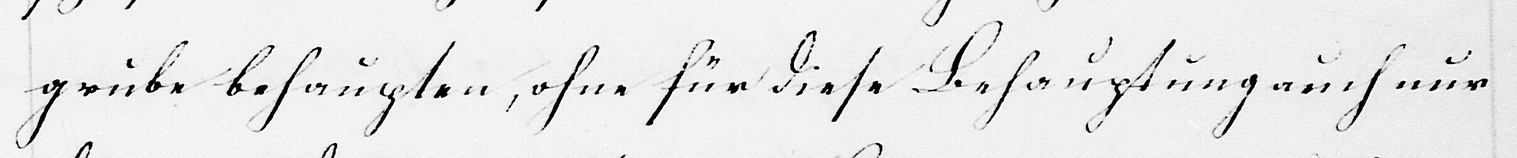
grube behaupten, ohne für diese Behauptung auch nur
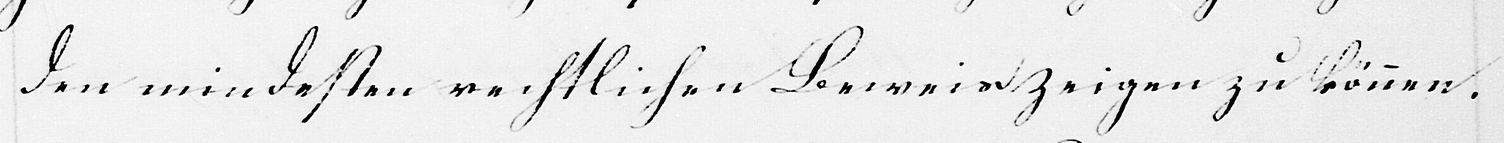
den mindesten rechtlichen Beweis zeigen zu können.
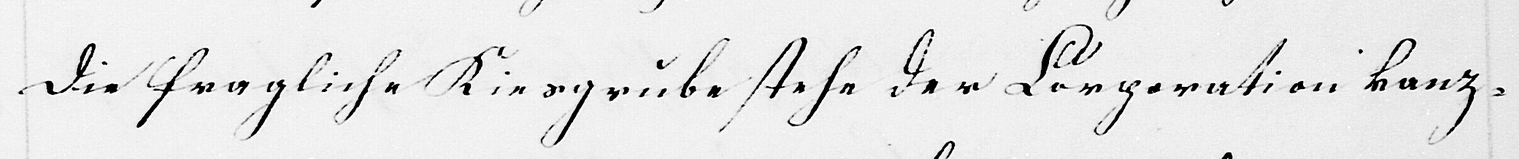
Die fragliche Kiesgrube stehe der Corporation kanz¬
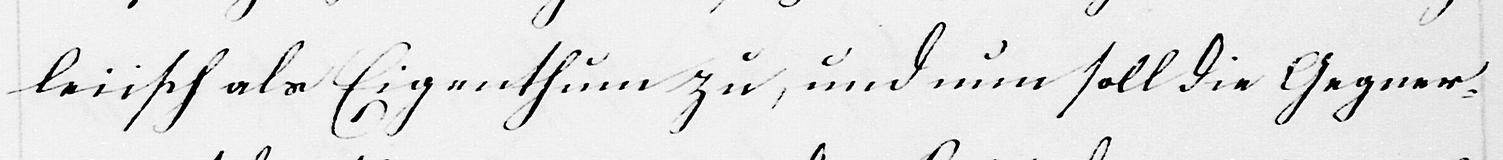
leiisch als Eigenthum zu, und nun soll die Gegner¬
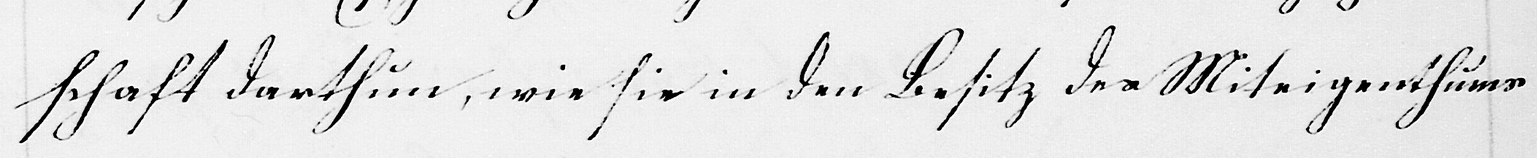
schaft darthun, wie sie in den Besitz des Miteigenthums
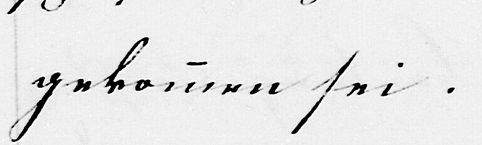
gekommen sei.
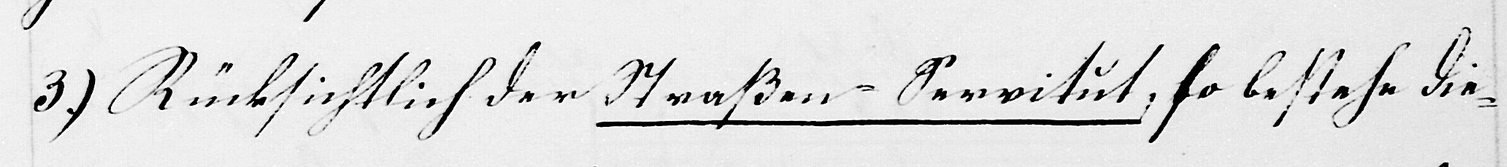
3.) Rücksichtlich der Straßen-Servitut, so bestehe die¬
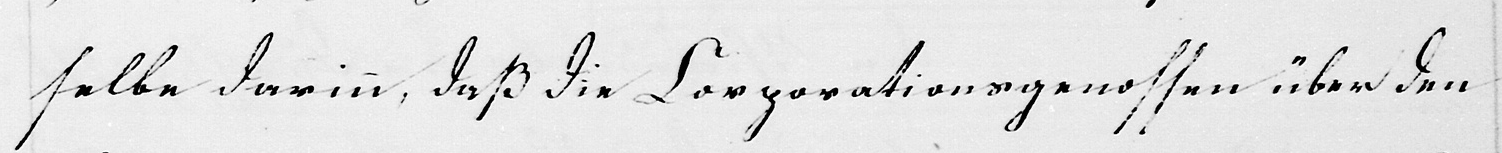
selbe darinn, daß die Corporationsgenossen über den
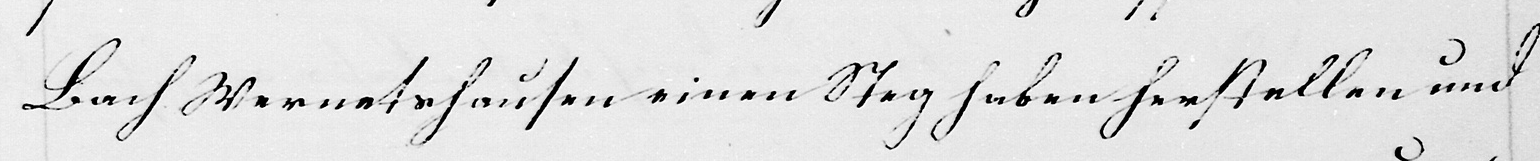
Bach Wernetshausen einen Steg haben herstellen und
